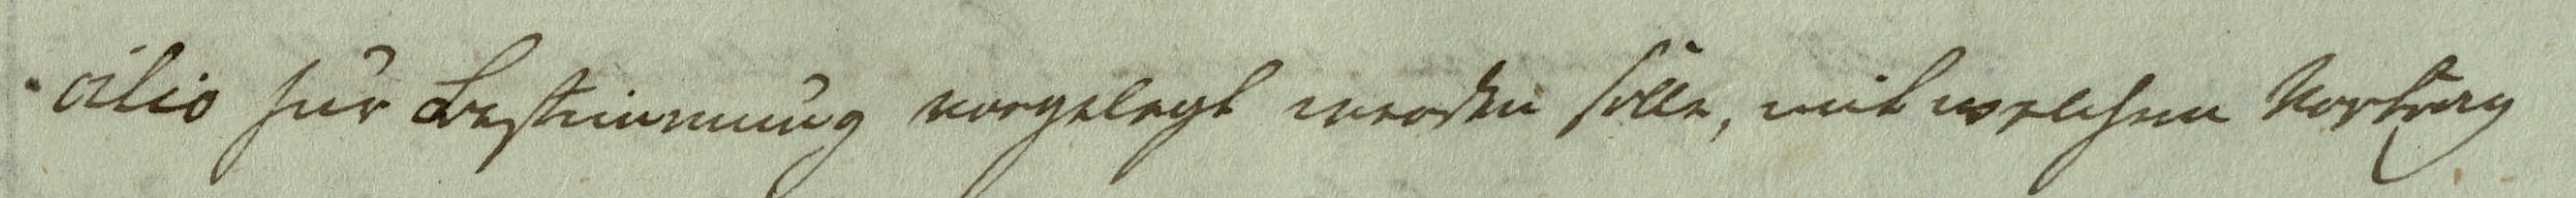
cilio zur Bestimmung vorgelegt werden solle, mit welchem Vortrag
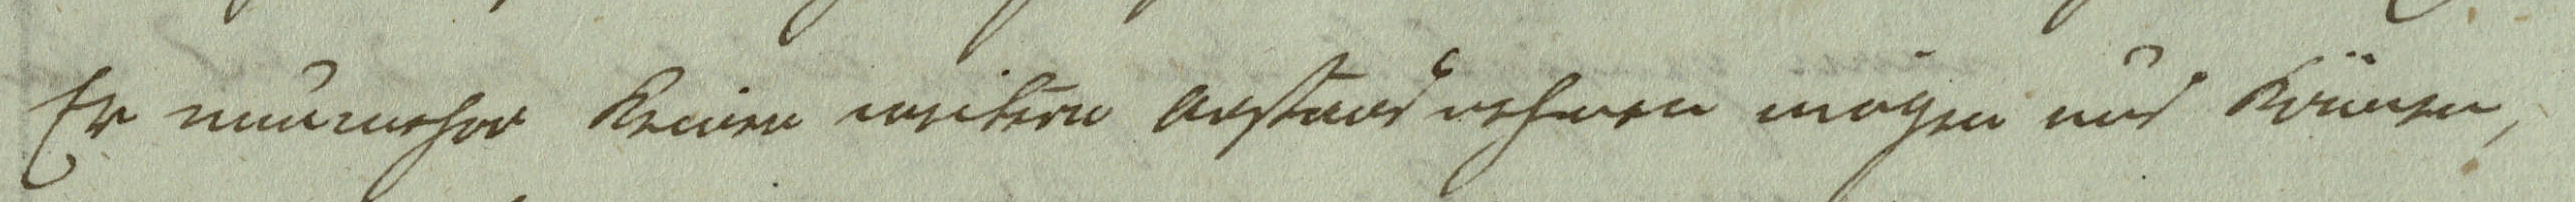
Er nunmehro keinen weitern Anstand nehmen mögen und können,
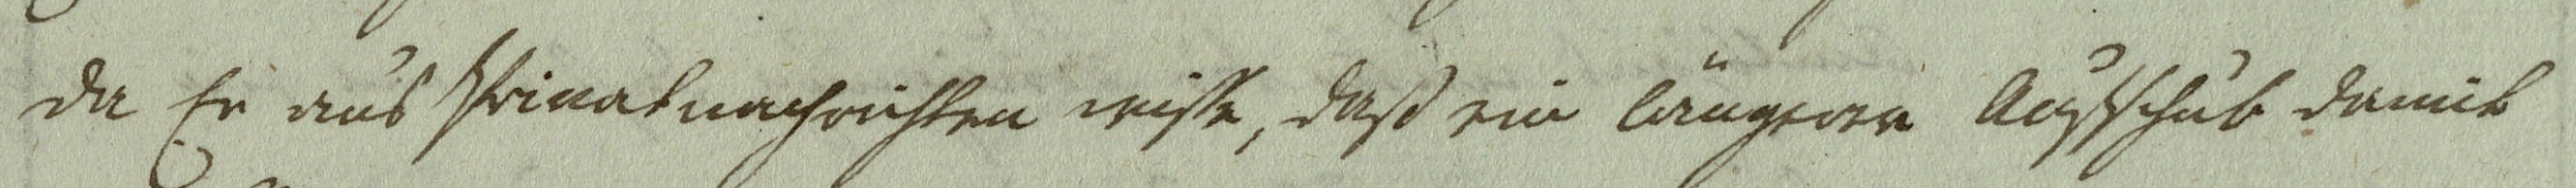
da Er aus Privatnachrichten wisse, daß ein längerer Aufschub damit
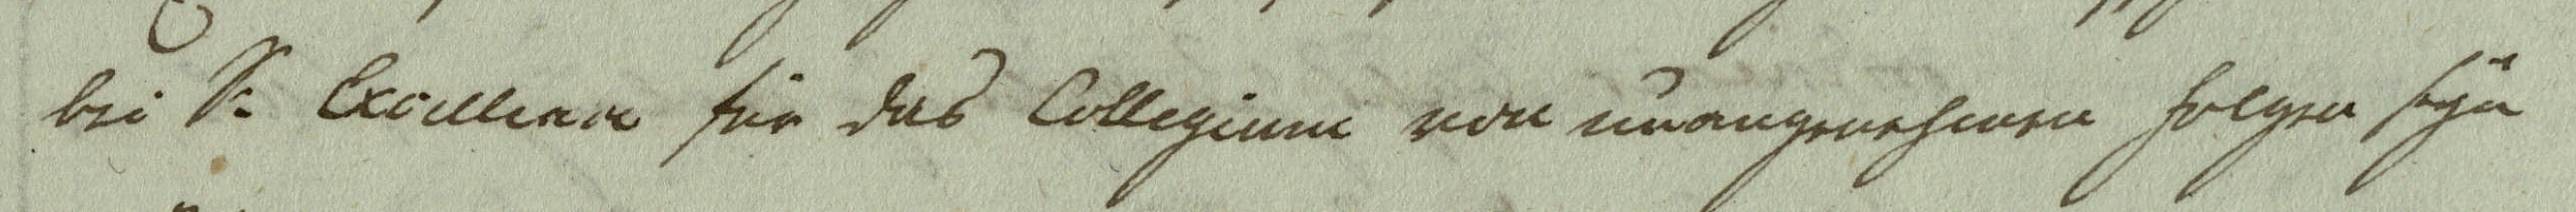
bei Sr. Excellence für das Collegium von unangenehmen Folgen seÿn
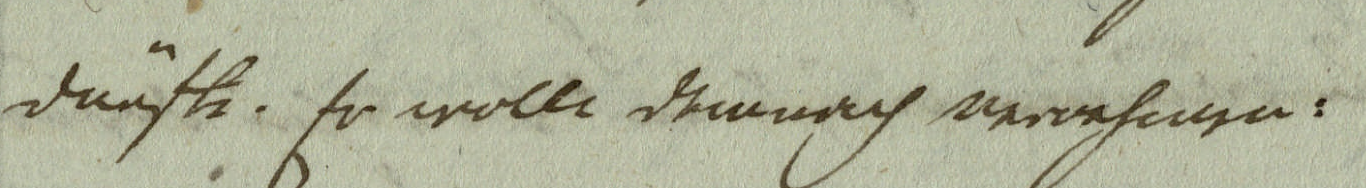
dürfte. Er wolle demnach vernehmen:
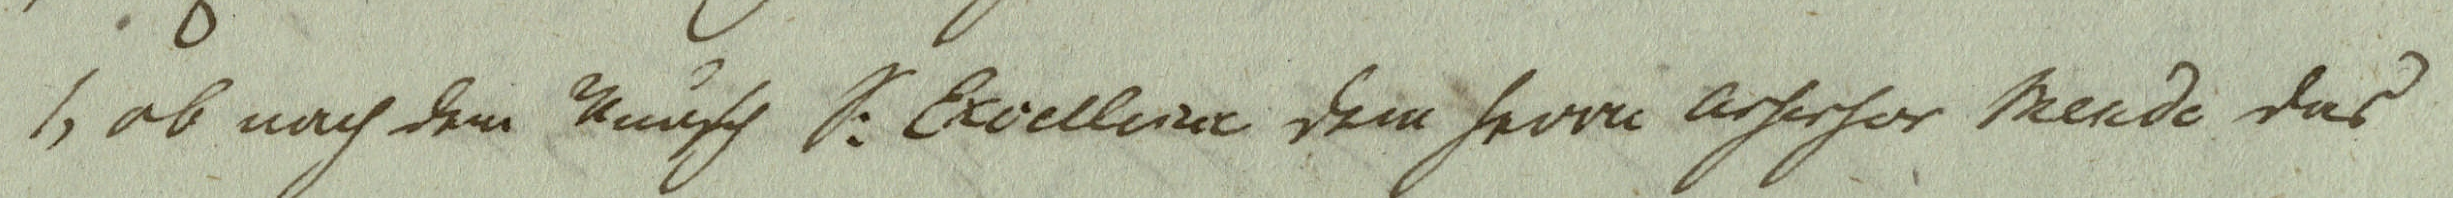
1, ob nach dem Wunsch Sr. Excellence dem herrn Assessor Mende das
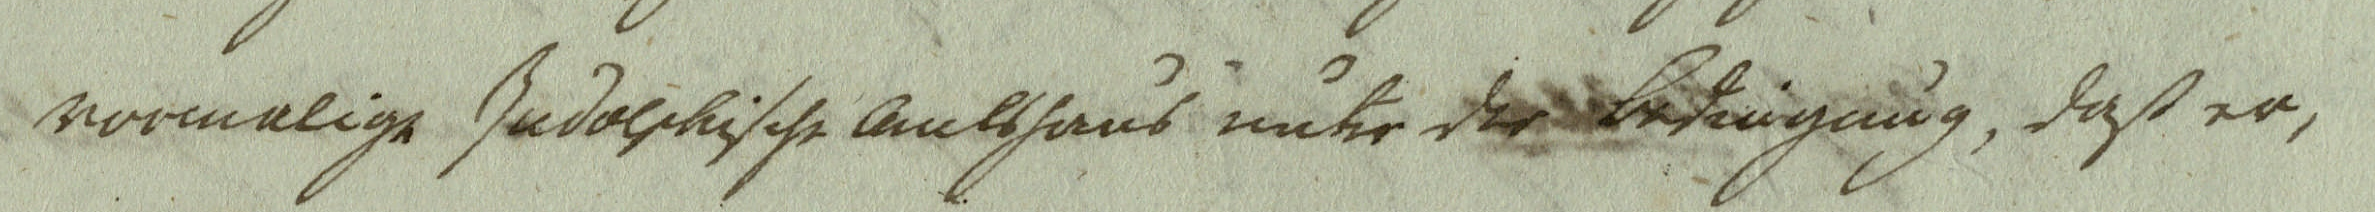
vormalige Rudolphische Amtshaus unter der Bedingung, daß er,
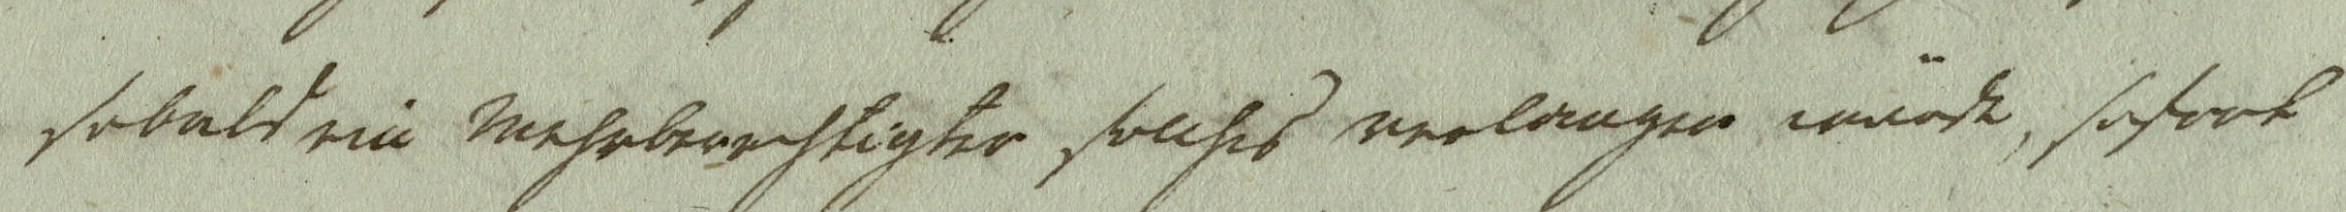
sobald ein Mehrberechtigter solches verlangen würde, sofort
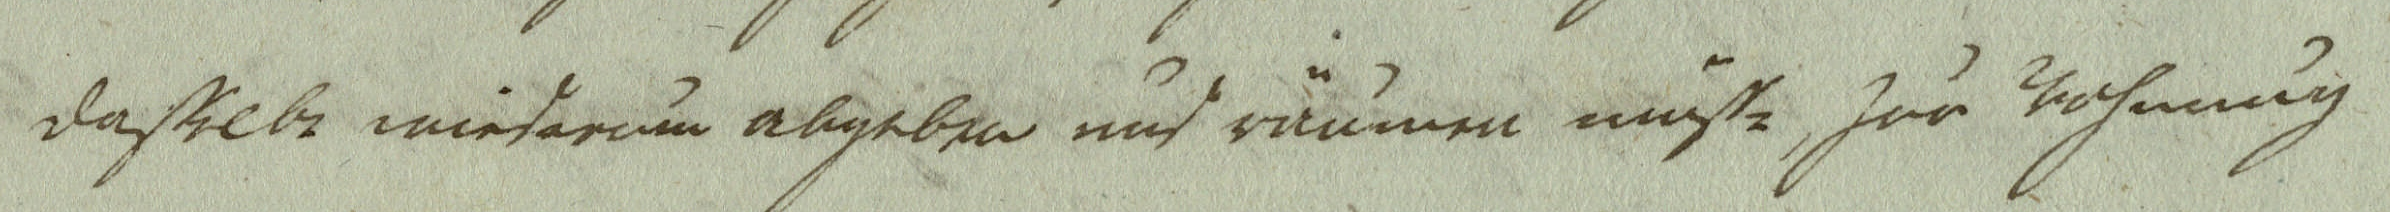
dasselbe wiederum abgeben und räumen müsse, zur Wohnung
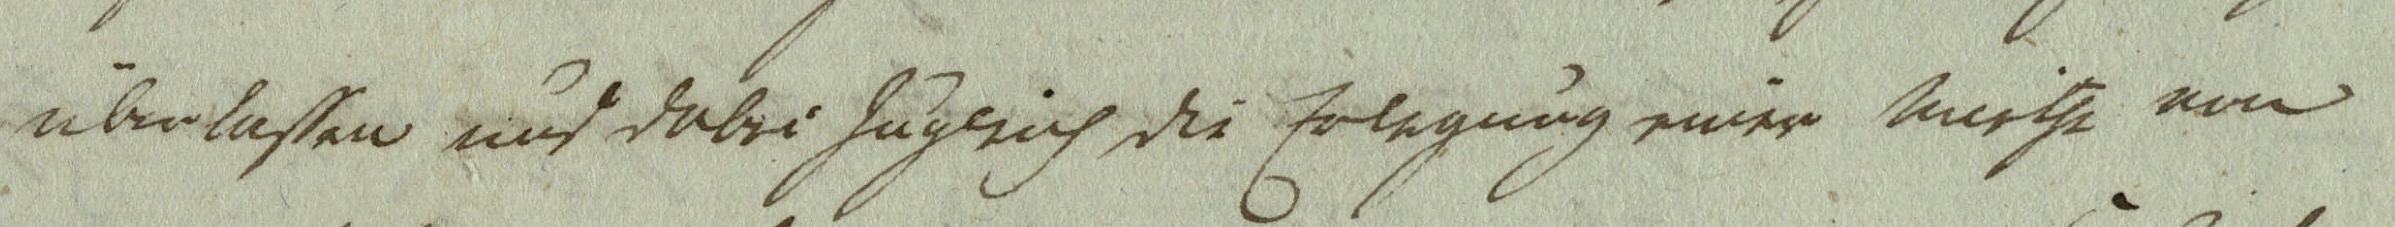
überlassen und dabei zugleich die Erlegung einer Miethe von
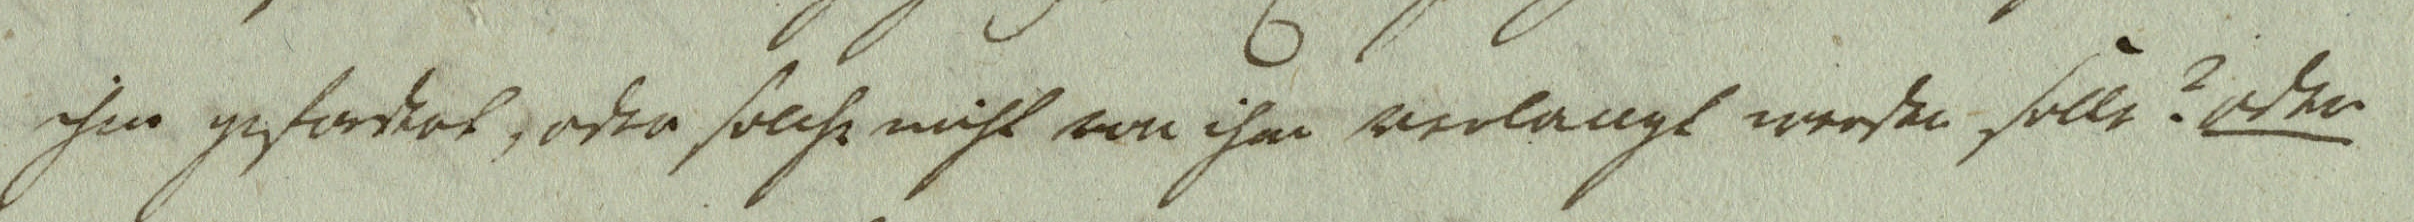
ihm gefordert, oder solche nicht von ihm verlangt werden solle? oder
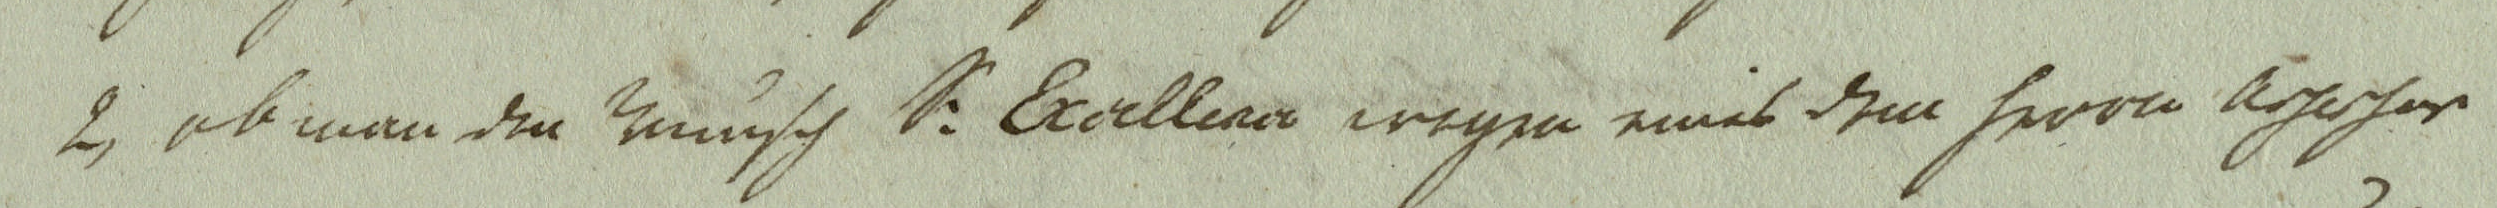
2. ob man den Wunsch Sr. Excellence wegen eines dem herrn Assessor
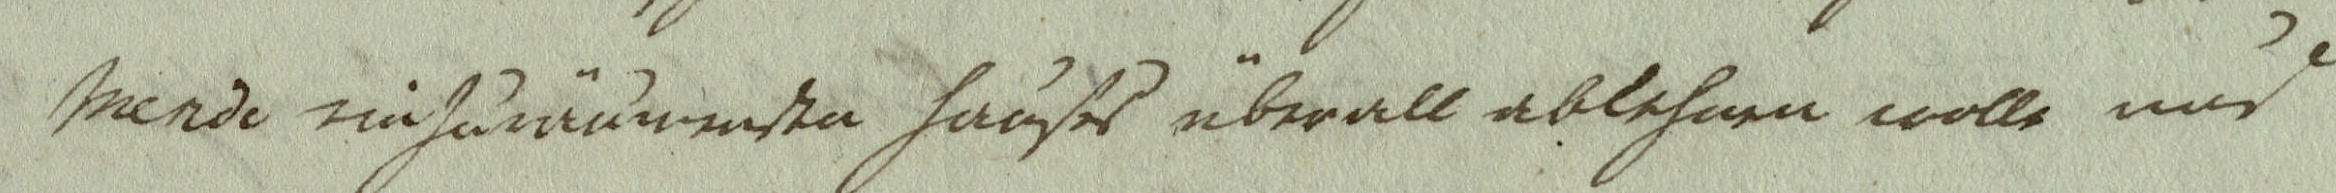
Mende einzuräumenden hauses überall ablehnen wolle und
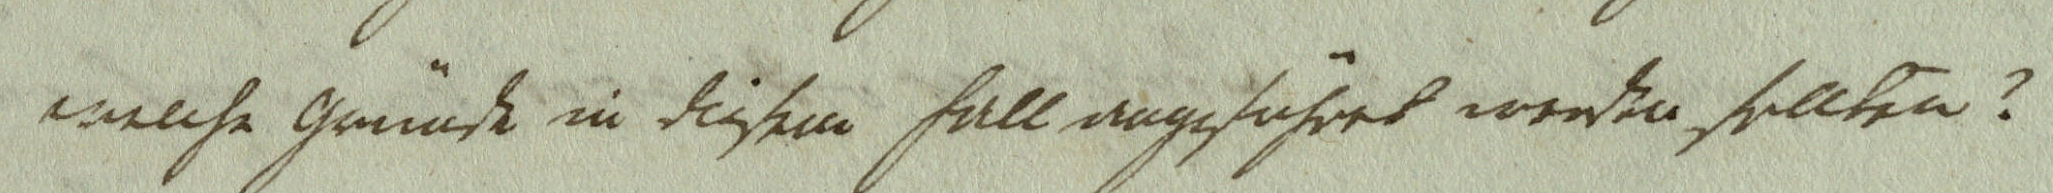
welche Gründe in diesem Fall angeführet werden sollten?
